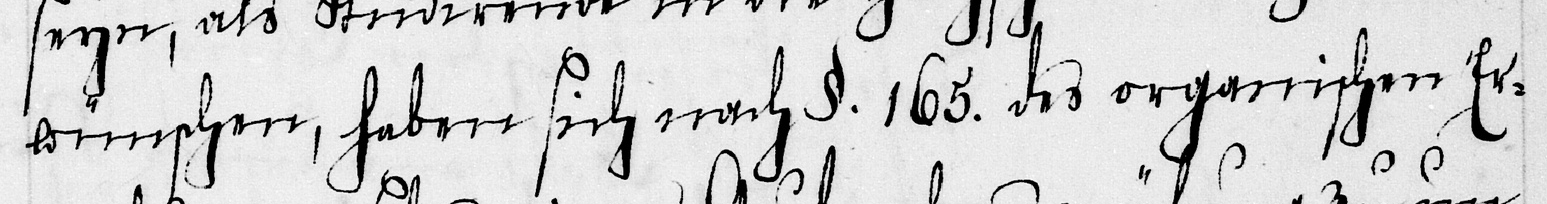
wünschen, haben sich nach §. 165. des organischen Er¬
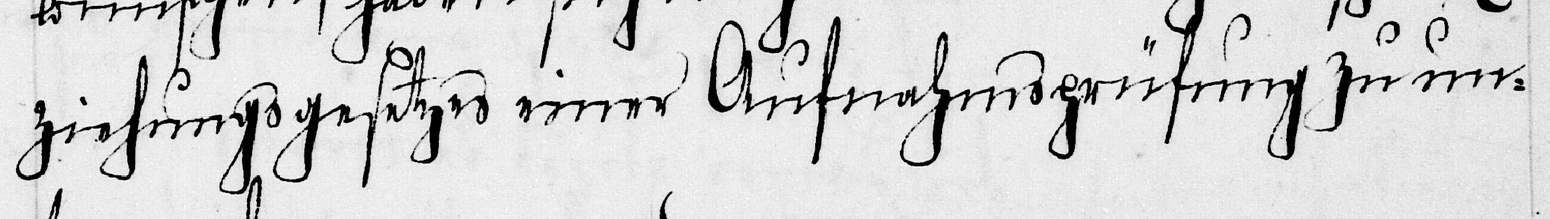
ziehungsgesetzes einer Aufnahmsprüfung zu un¬
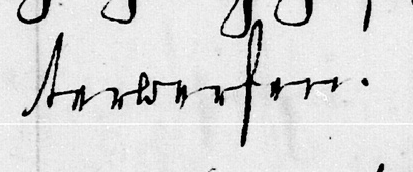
terwerfen.
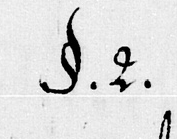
§. 2.
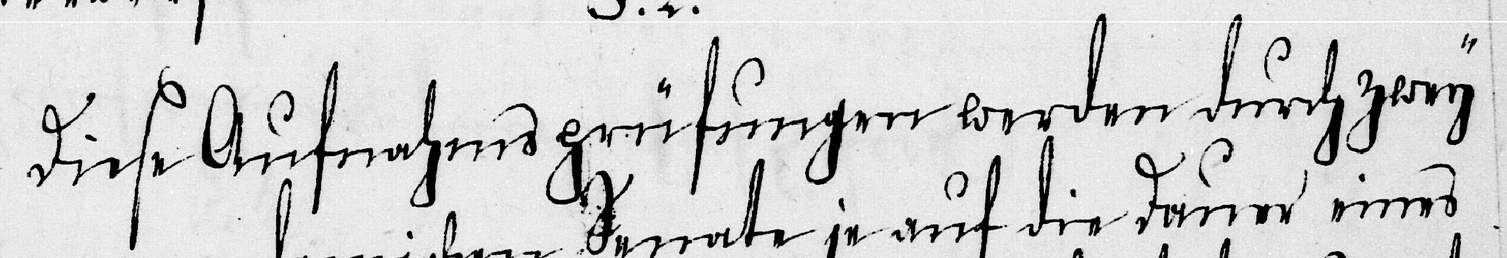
Diese Aufnahmsprüfungen werden durch zwey
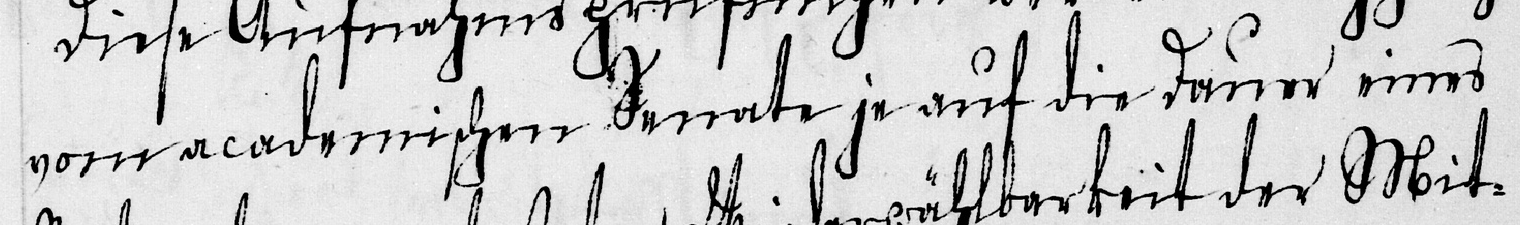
vom academischen Senate je auf die Dauer eines
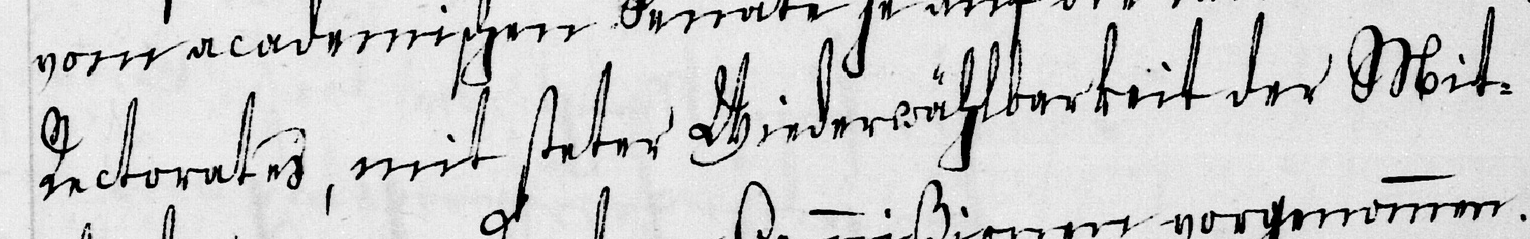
Rectorates, mit steter Wiederwählbarkeit der Mit¬
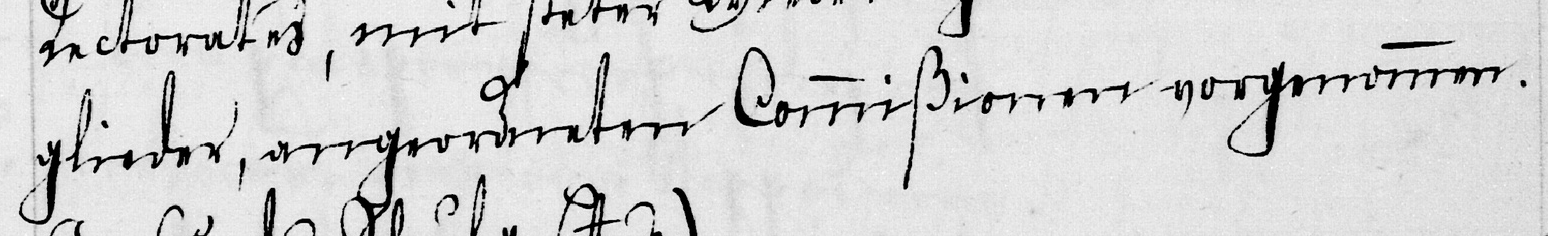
glieder, angeordneten Commißionen vorgenommen.
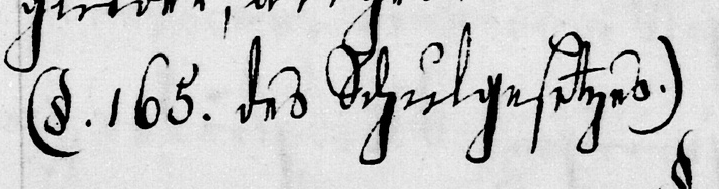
(§. 165. des Schulgesetzes.)
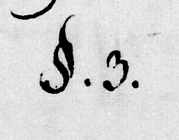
§. 3.
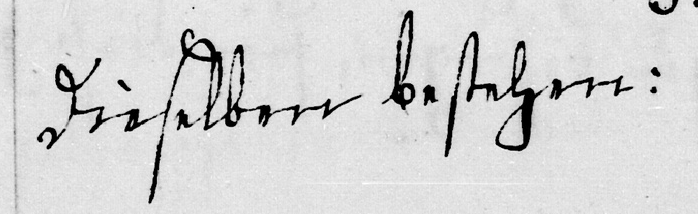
Dieselben bestehen:
